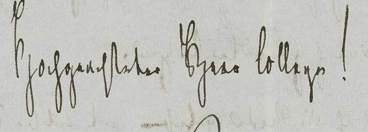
Hochgeachteter Herr
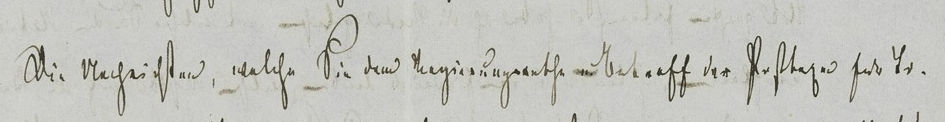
Die Nachrichten, welche Sie dem Regierungsrathe in Betreff der Postwagen für Lo-
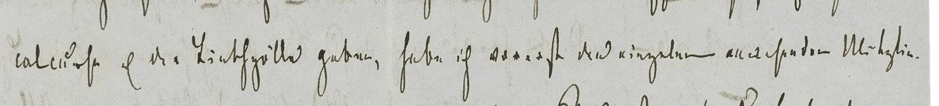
calcurse & die Linthzölle geben, habe ich vorerst den einzelnen anwesenden Mitglie-
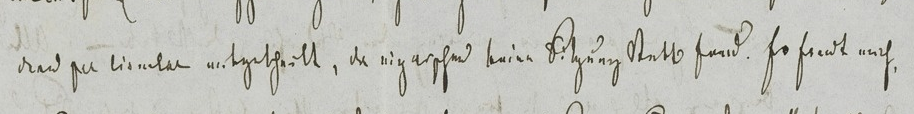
dern per Circular mitgetheilt, da inzwischen keine Sitzung Statt fand. Es freut mich,
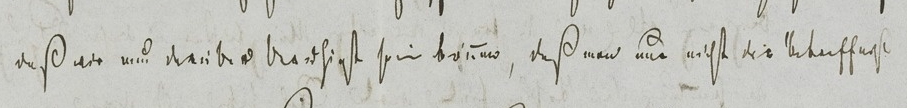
daß wir nun darüber beruhigt sein können, daß man uns nicht die Betreffniß
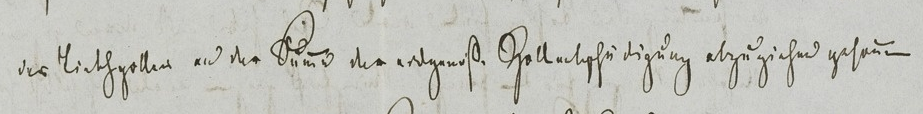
des Linthzolles an der Summe der eidgenöß. Zollentschädigung abzuziehen gesonnen
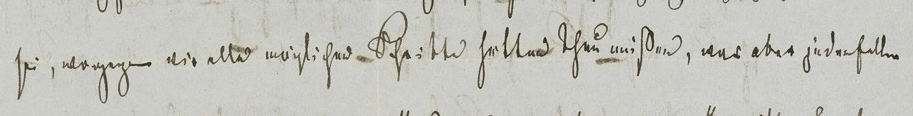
sei, wogegen wir alle möglichen Schritte hätten thun müssen, was aber jedenfalles
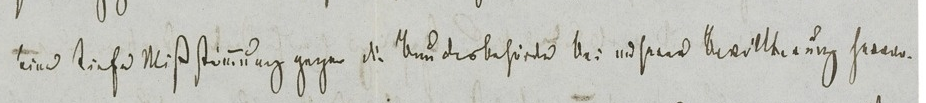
eine tiefe Mißstimmung gegen die Bundesbehörde bei unserer Bevölkerung hervor-
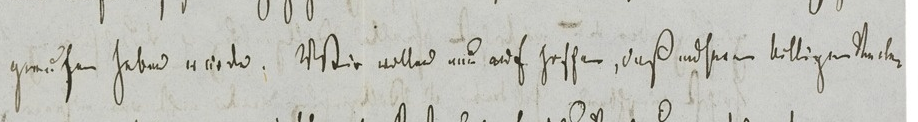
gerufen haben würde. Wir wollen nun auch hoffen, daß unserer billigen Recla-
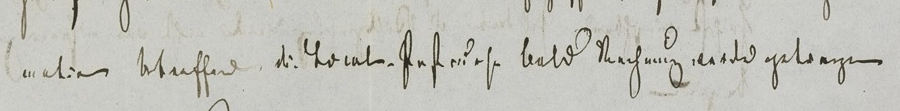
mation betreffend die Local-Postcurse bald Rechnung werde getragen
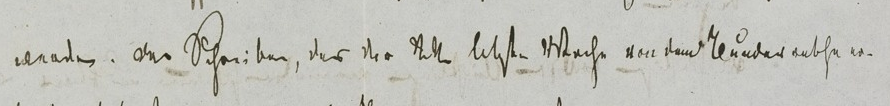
werden. Das Schreiben, das der R.R. letzte Woche von dem Bundesrathe er-
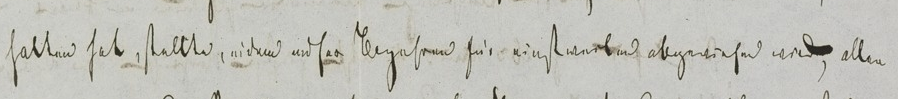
halten hat, stellte, indem unser Begehren für einstweilen abgewiesen wird, aller-
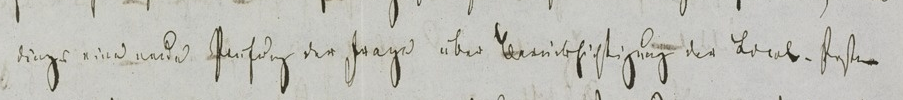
dings eine neue Prüfung der Frage über Berücksichtigung der Local-Posten
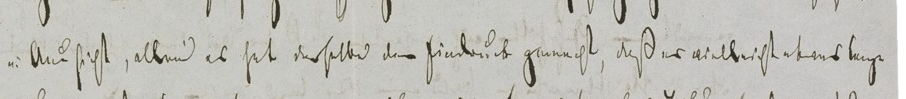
in Aussicht, allein es hat dasselbe den Eindruck gemacht, daß es vielleicht etwas lange
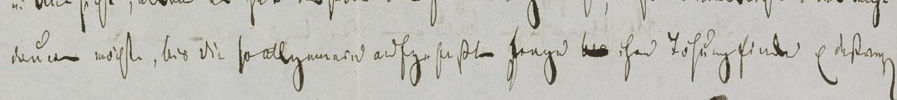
dauern möchte, bis die so allgemein aufgefaßte Frage bes ihre Lösung finde & deßwegen
